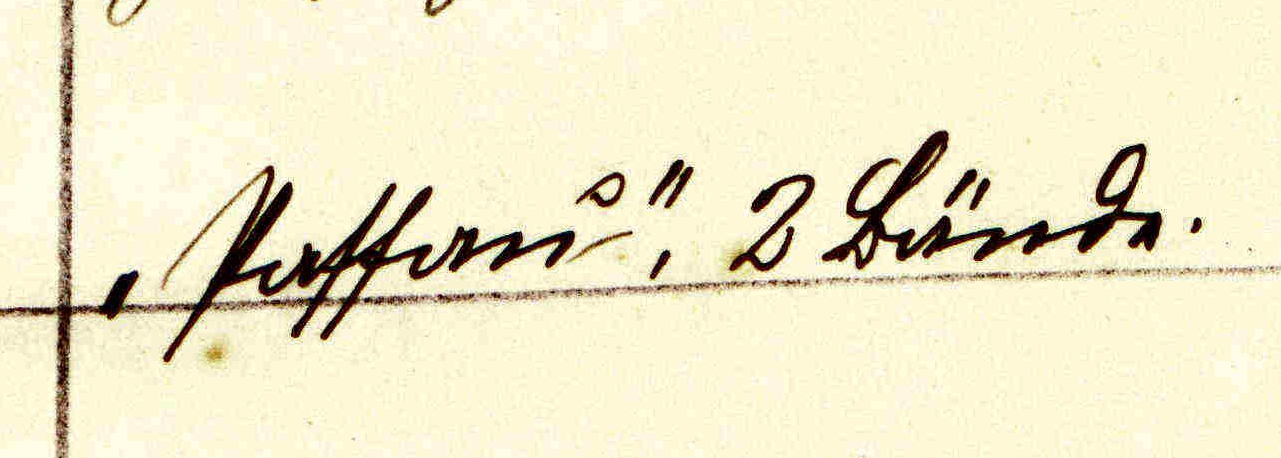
„Passau“. 2 Bände
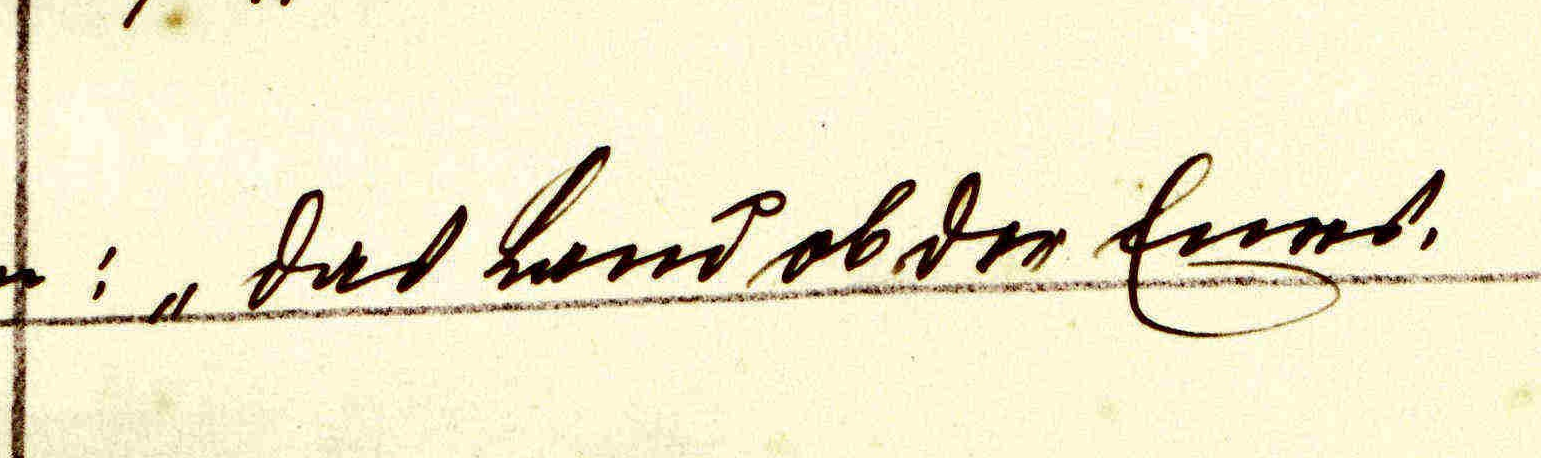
„Das Land ob der Enns.“
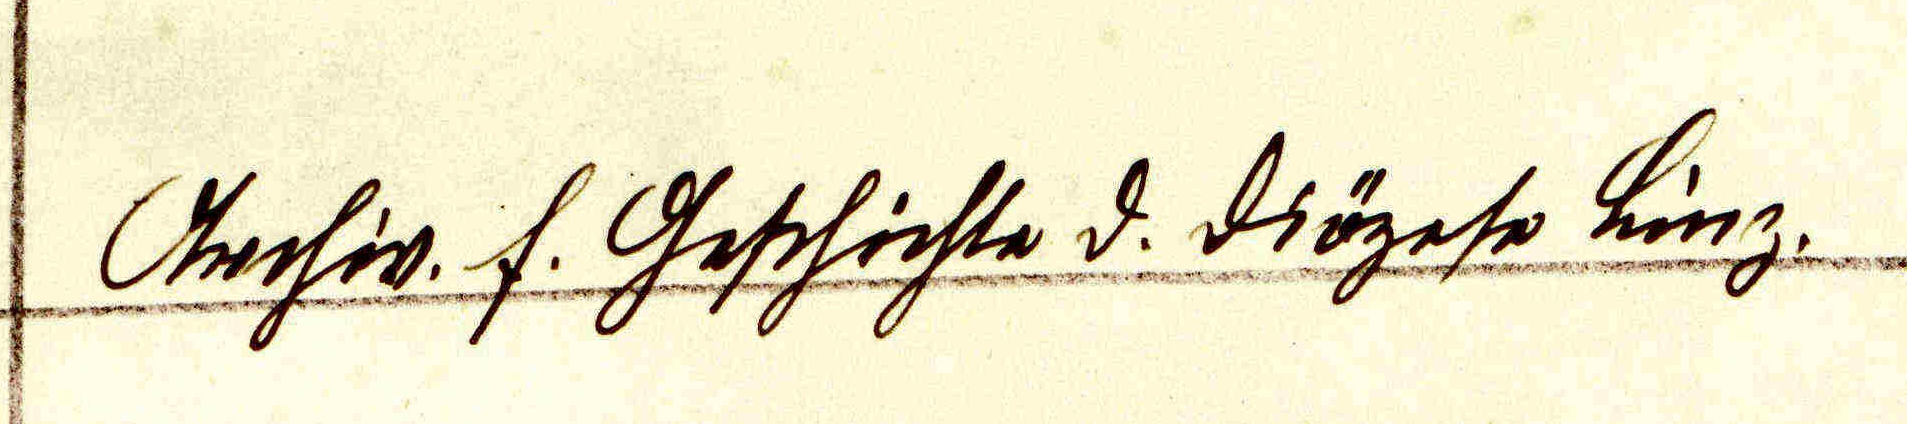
Archiv f. Geschichte d. Diözese Linz.
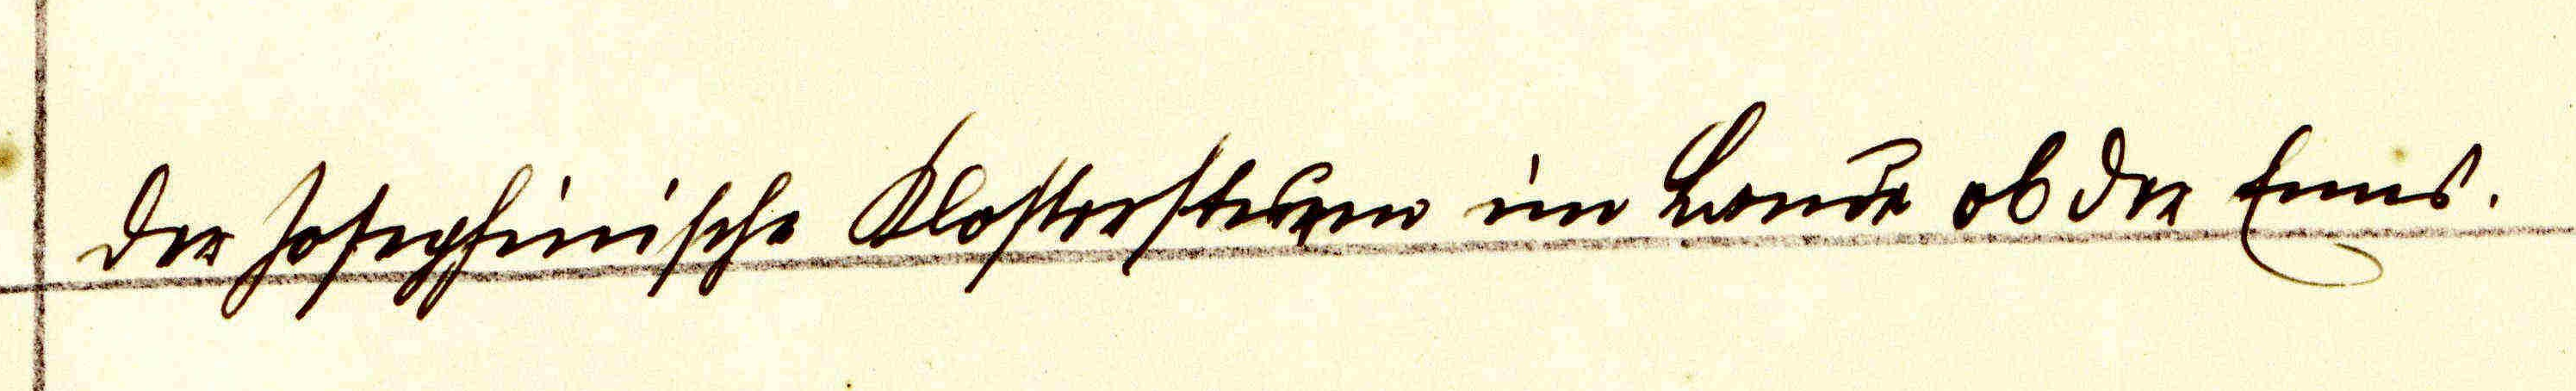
Der Josephinische Klostersturm Im Land ob der Enns
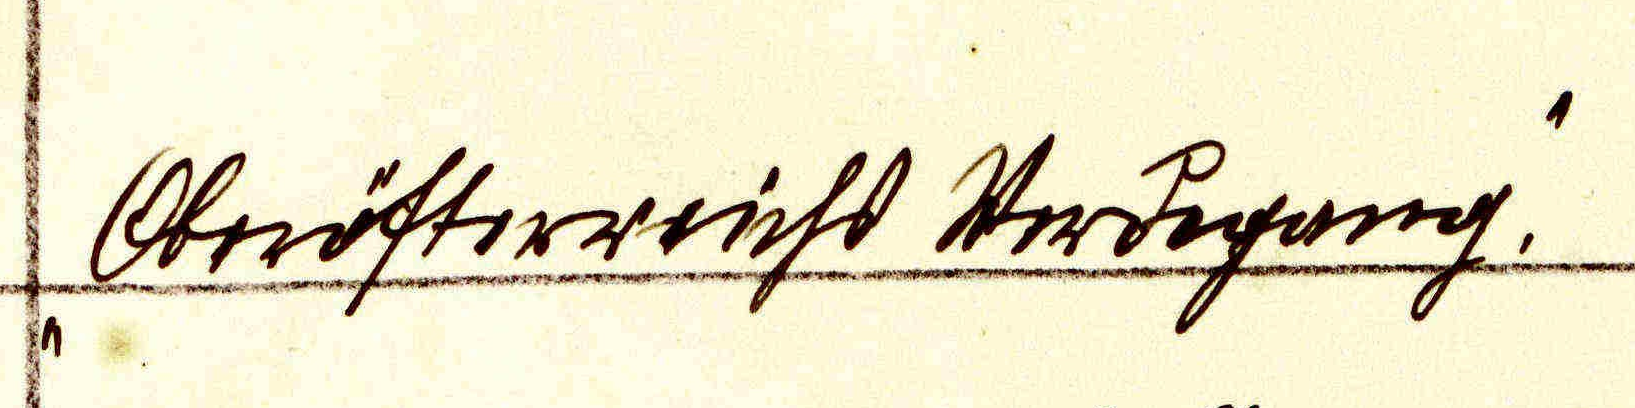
Österreichs Werdegang
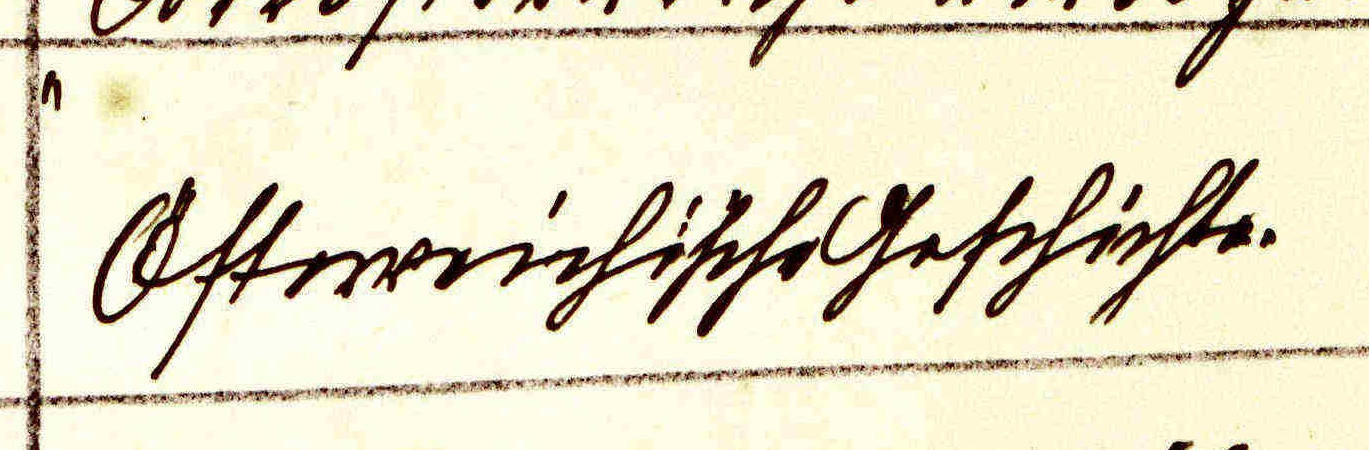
Österreichische Geschichte
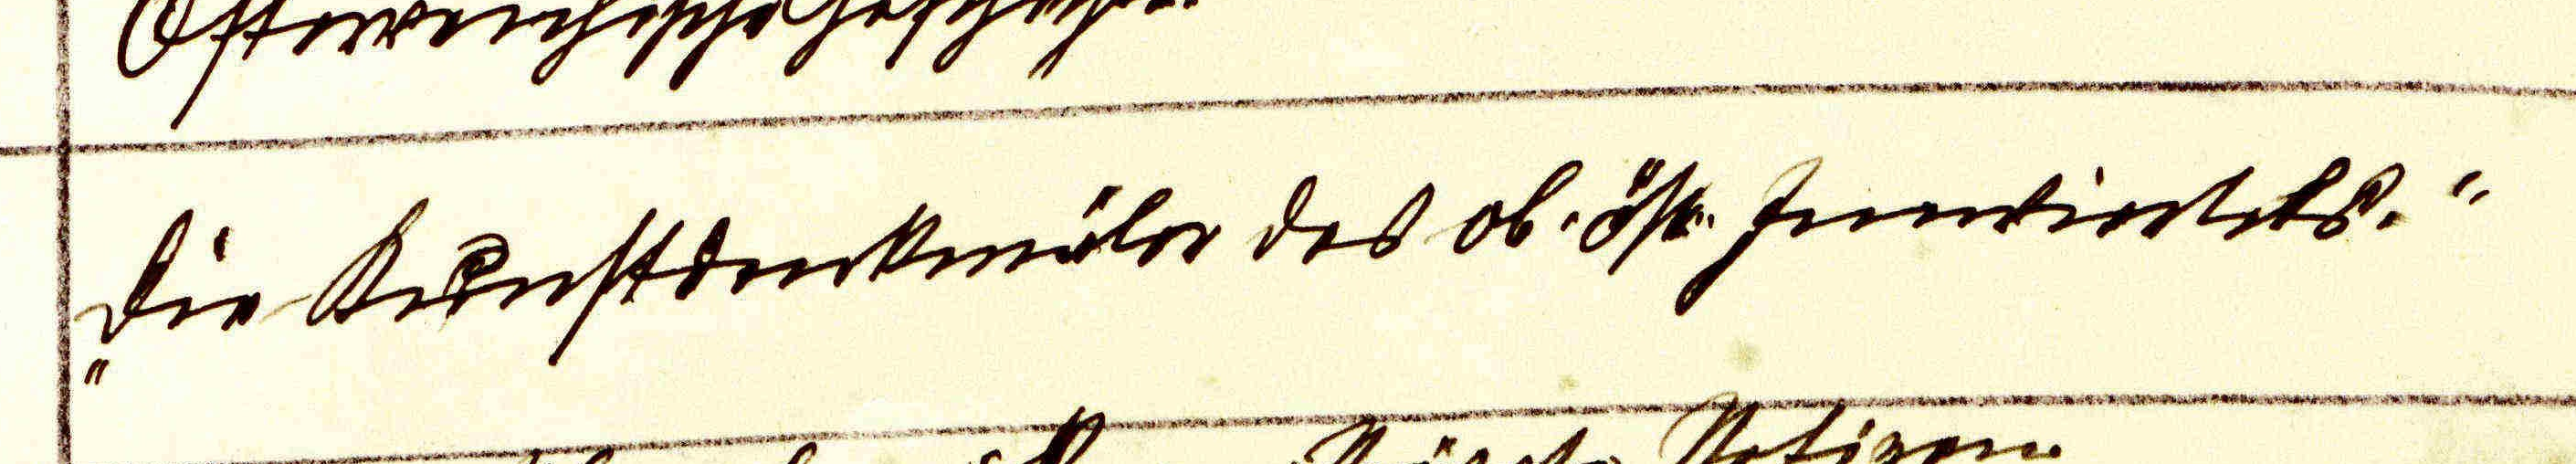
"Die Kunstdenkmäler des ob. öst. Innviertels.“
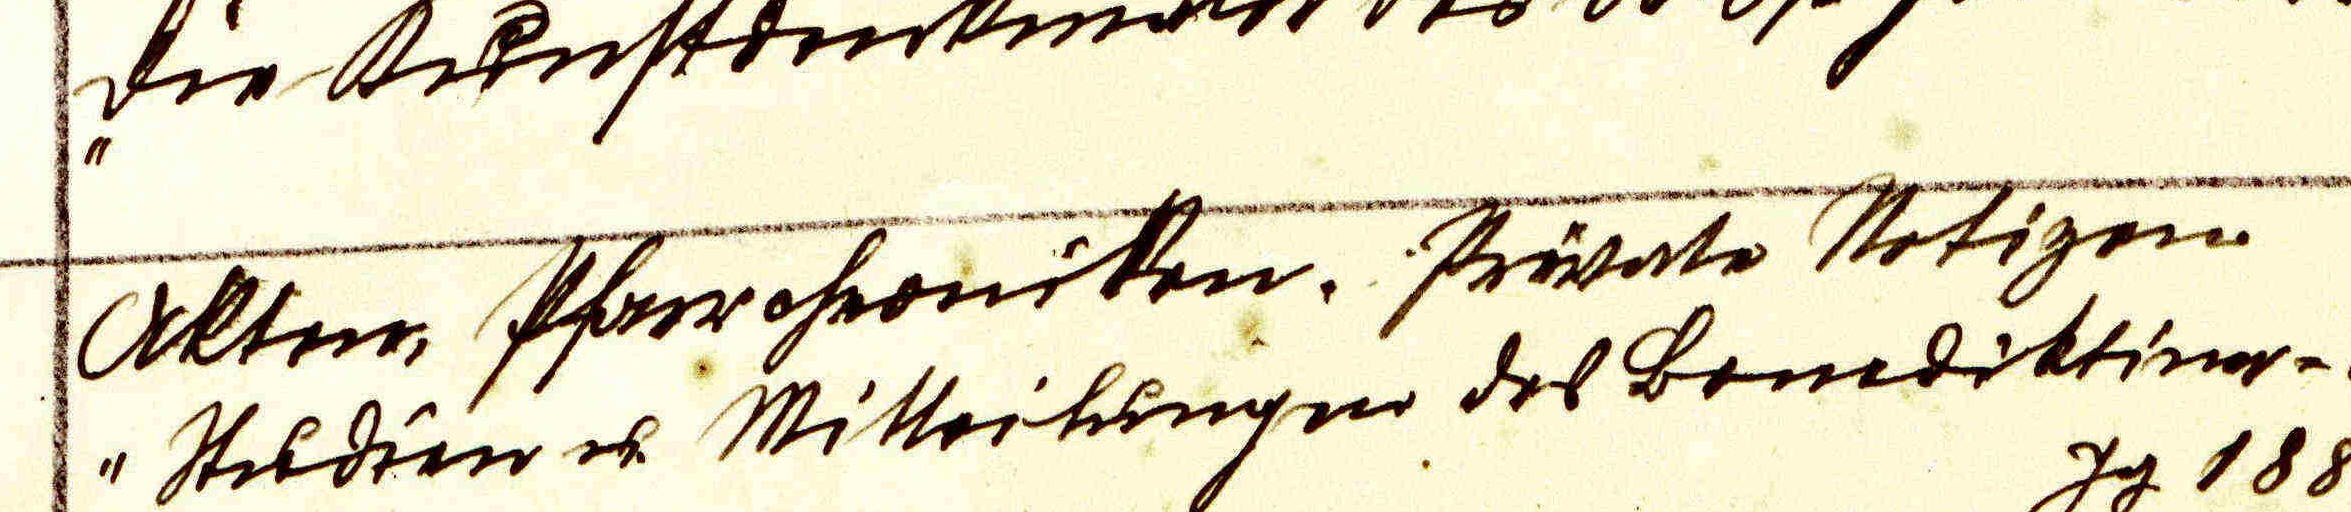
Akten, Pfarrchroniken, private Notizen
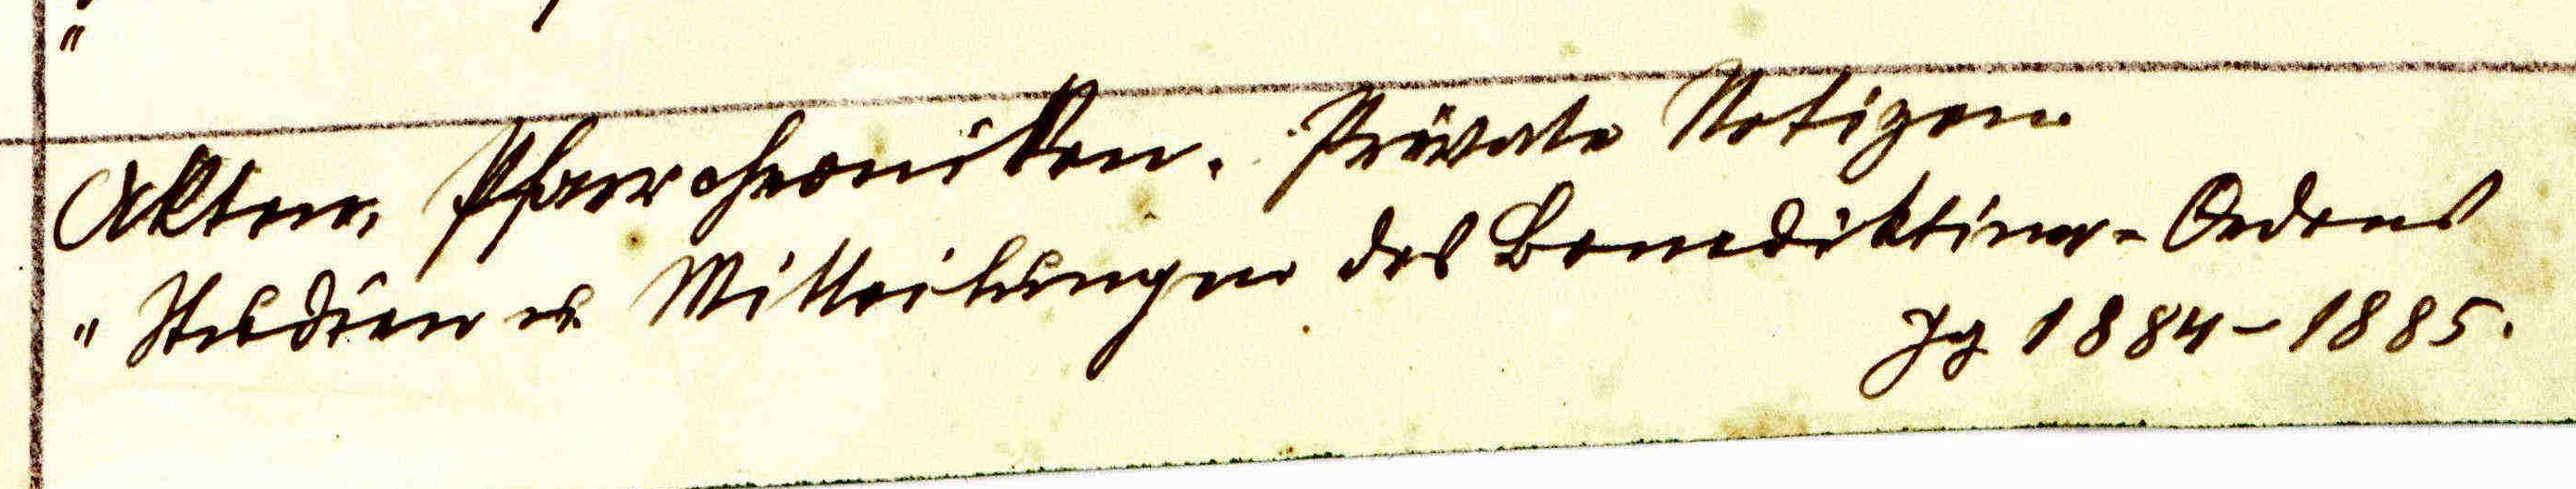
Studien u. Mitteilungen des Benediktiner Ordens
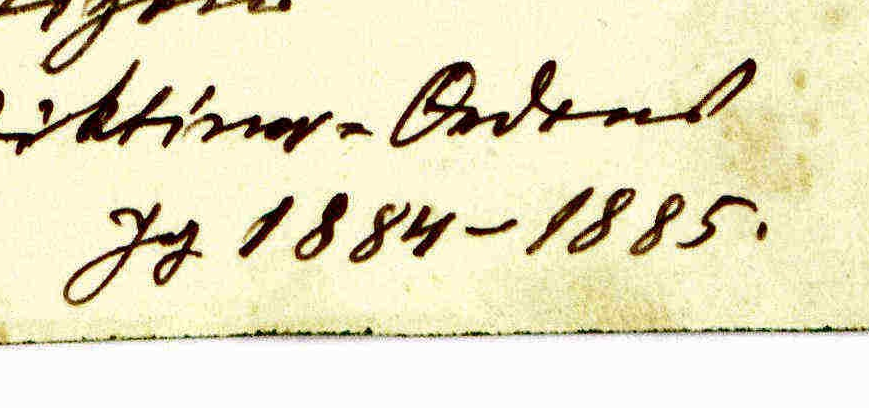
Jg 1884-1885.
